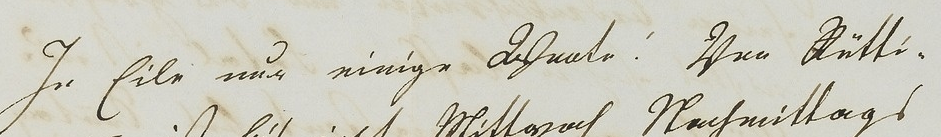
In Eile nur einige Worte! Von Rütti-
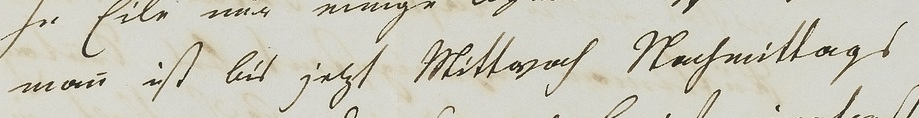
mann ist bis jetzt Mittwoch Nachmittags
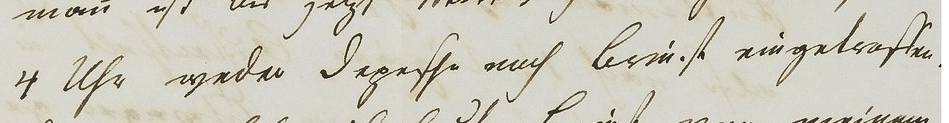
4 Uhr weder Depesche noch Brief eingetroffen.
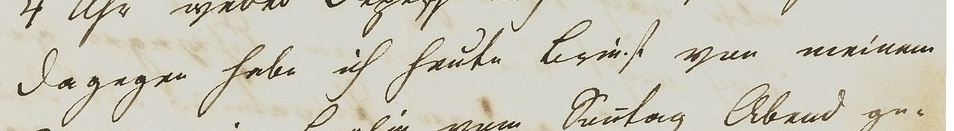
Dagegen habe ich heute Brief von meinem
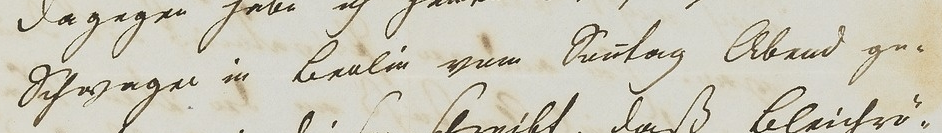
Schwager in Berlin vom Sonntag Abend ge-
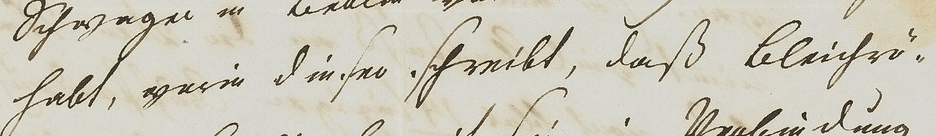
habt, worin dieser schreibt, daß Bleichrö-
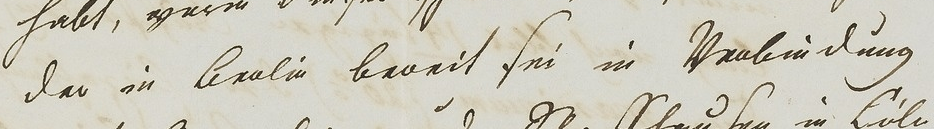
der in Berlin bereit sei in Verbindung
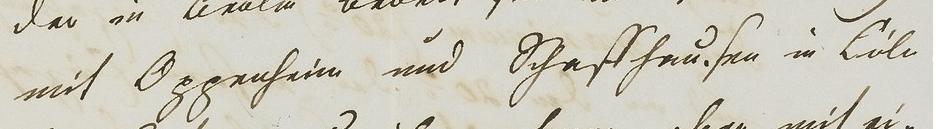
mit Oppenheim und Schaffhausen in Cöln
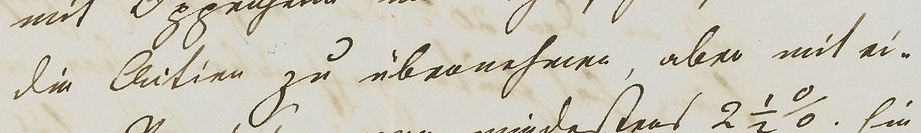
die Actien zu übernehmen, aber mit ei-
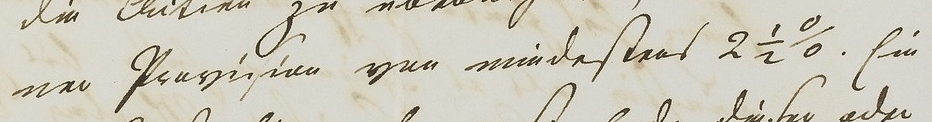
ner Provision von mindestens 2½%. Ein
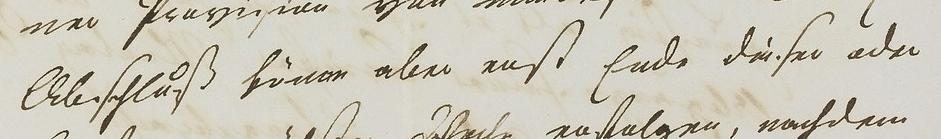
Abschluß könne aber erst Ende dieser oder
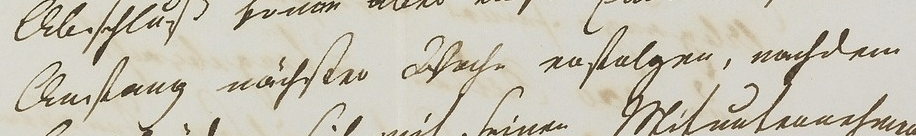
Anfang nächster Woche erfolgen, nachdem
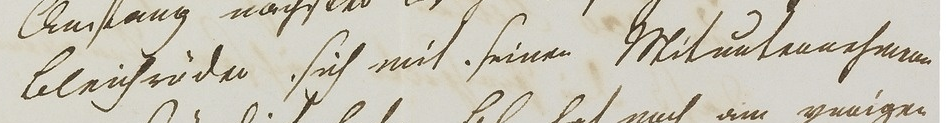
Bleichröder sich mit seinen Mitunternehmern
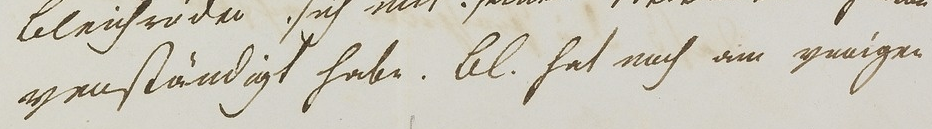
verständigt habe. Bl. hat noch am vorigen
